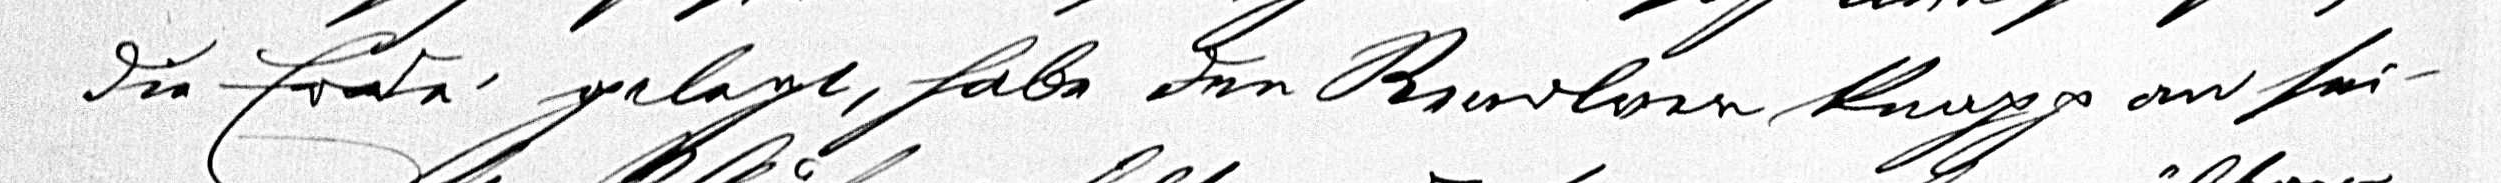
die Erde gelegt, habe den Revolver knapp an sei¬
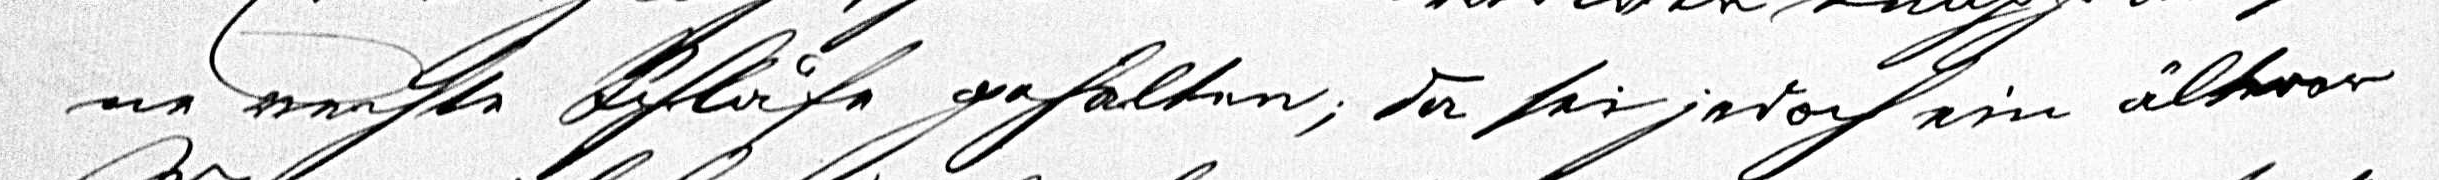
ne rechte Schläfe gehalten; da sei jedoch ein älterer
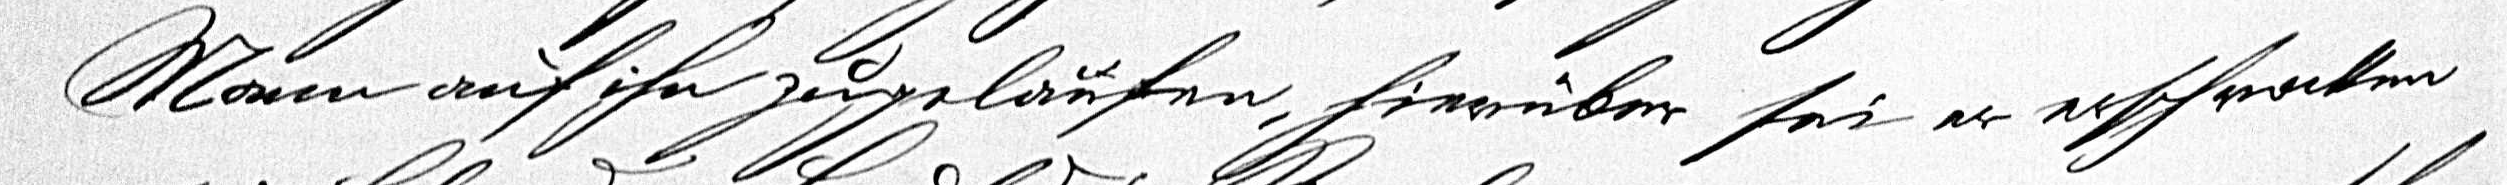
Mann auf ihn zugelaufen hierüber sei er erschrocken
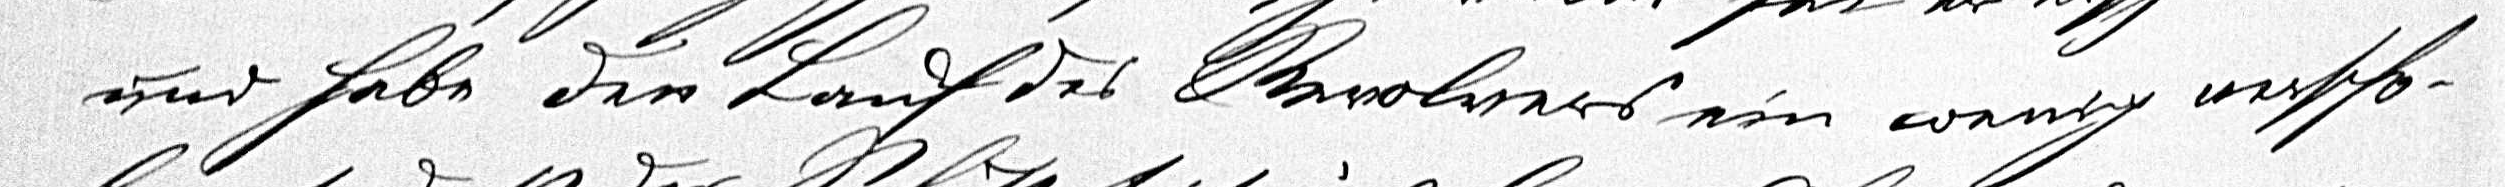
und habe den Lauf des Revolvers ein wenig verscho¬
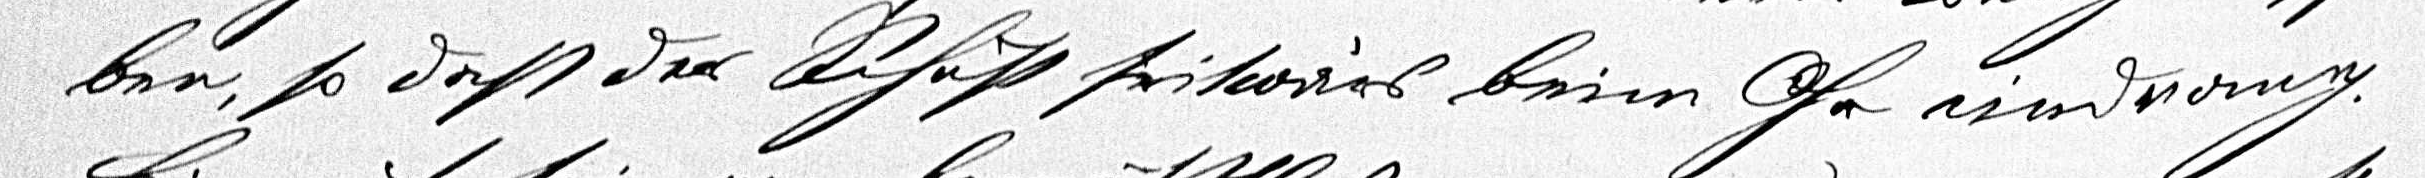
ben, so daß der Schuß seitwärs beim Ohr eindrang.
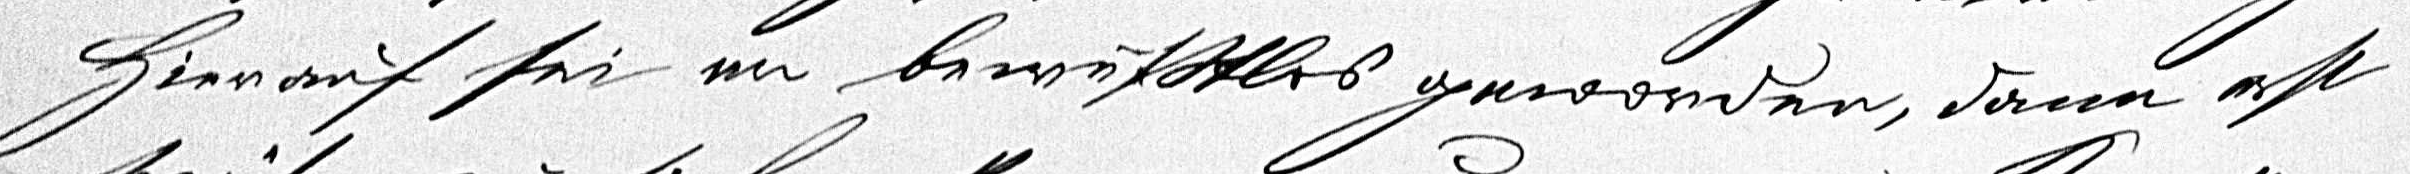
Hierauf sei er bewußtlos geworden, dann erst
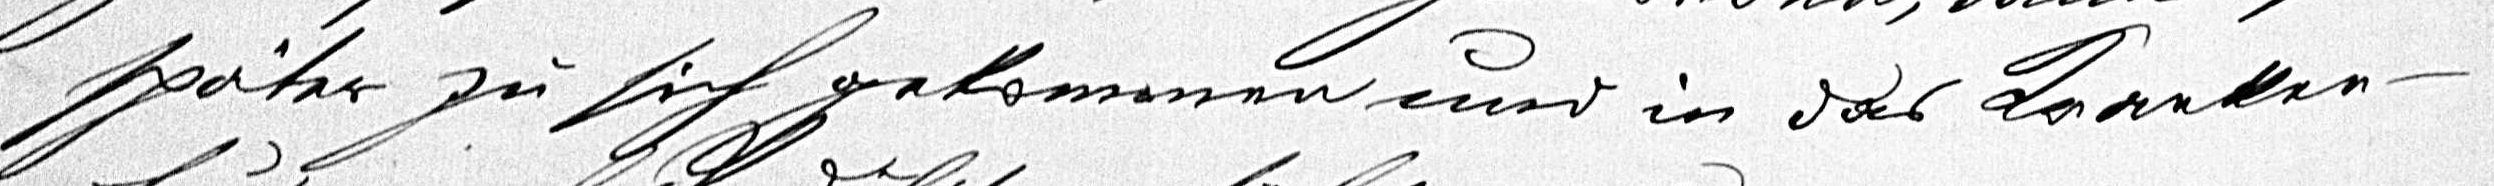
später zu sich gekommen und in der Kranken¬
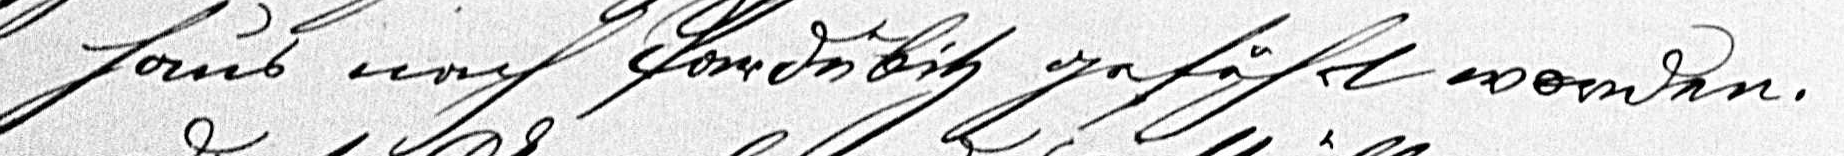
haus noch Pardubitz geführt worden.
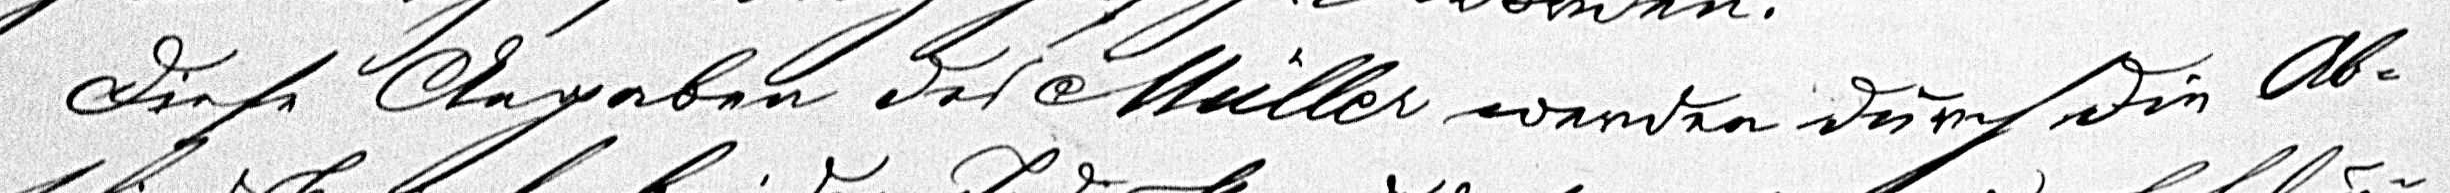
Diese Angaben der Müller werden durch die Ab¬
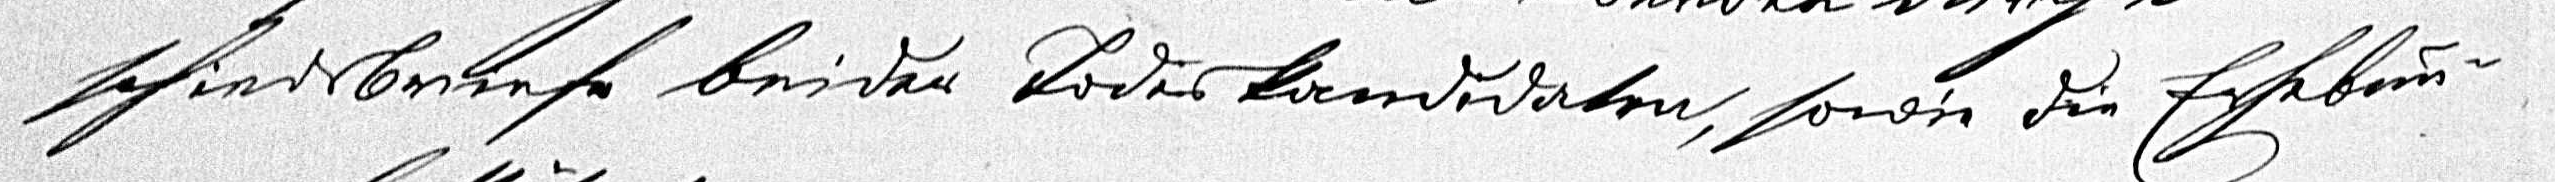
schiedsbriefe beider Todeskandidaten, sowie die Erhebun¬
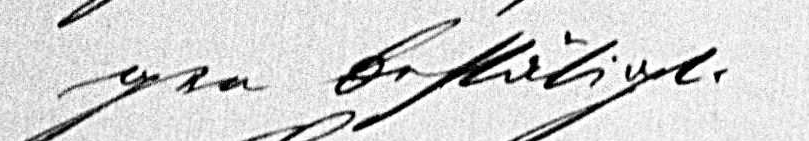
gen bestätigt.
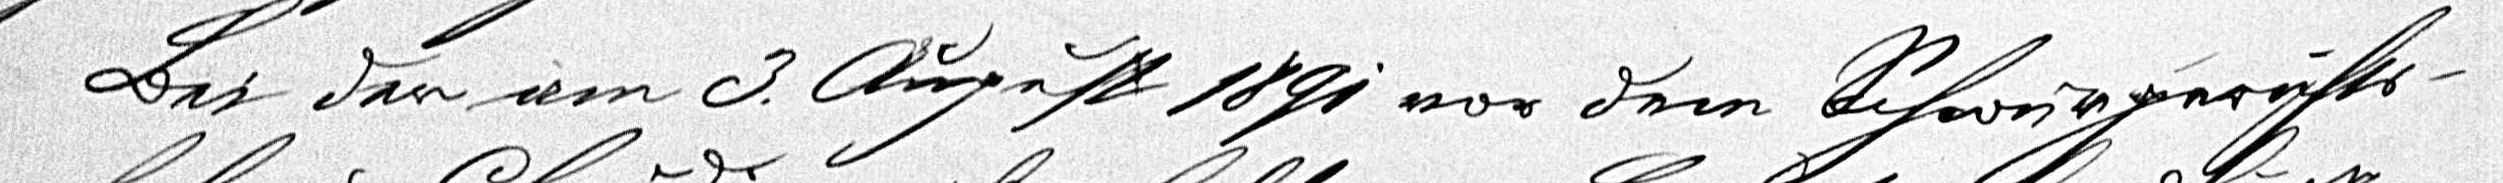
Bei der am 3. August 1891 vor dem Schwurgerichts¬
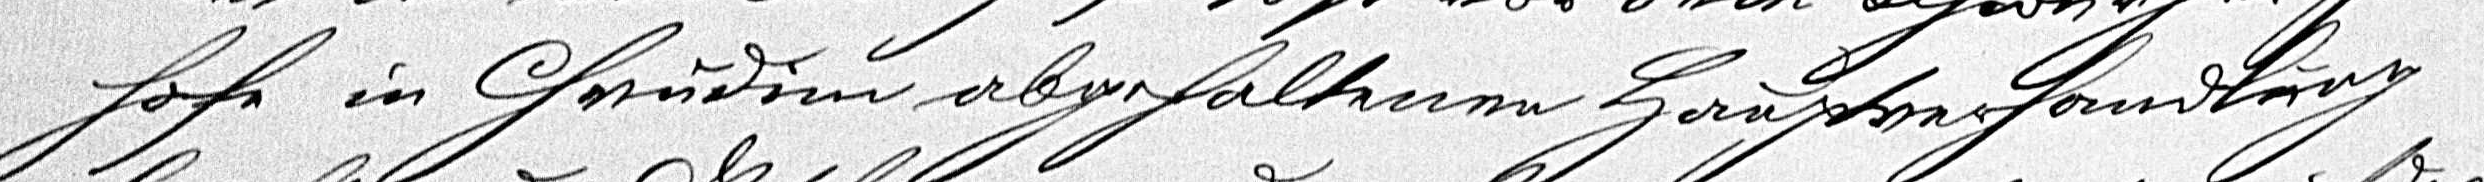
hofe in Grudim abgehaltenen Hauptverhandlung
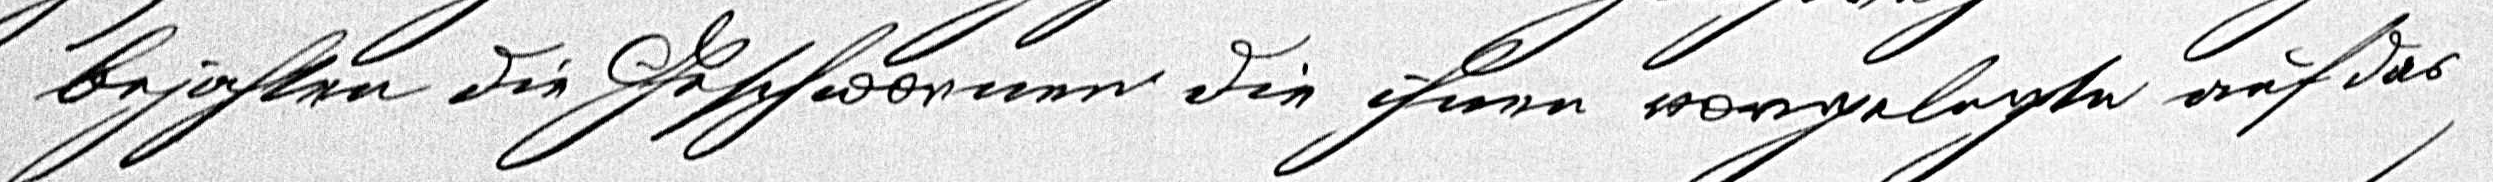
bejahten die Geschworenen die ihnen vorgelegte auf das
